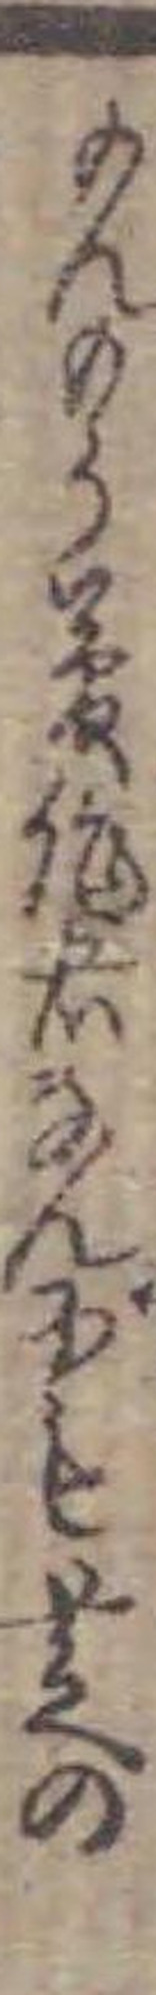もんもう夢作者なんにも芝の
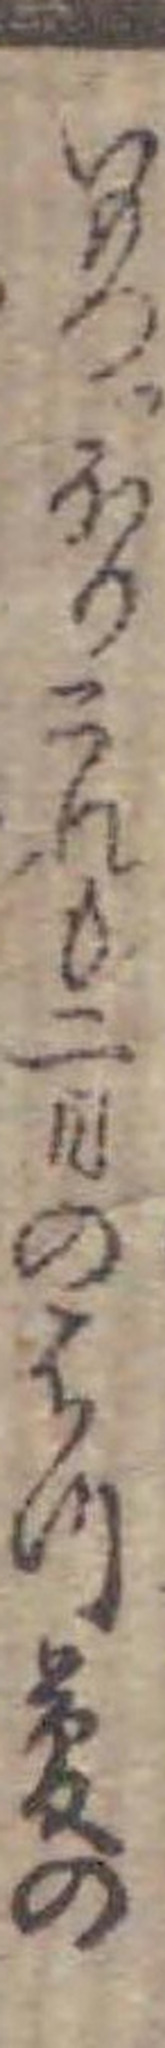いもつほりこれも二日のはつ夢の
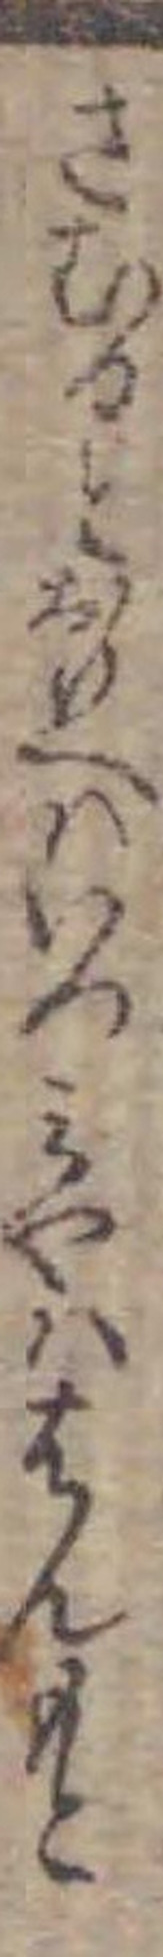さむるとおもへはいつみやははんもと
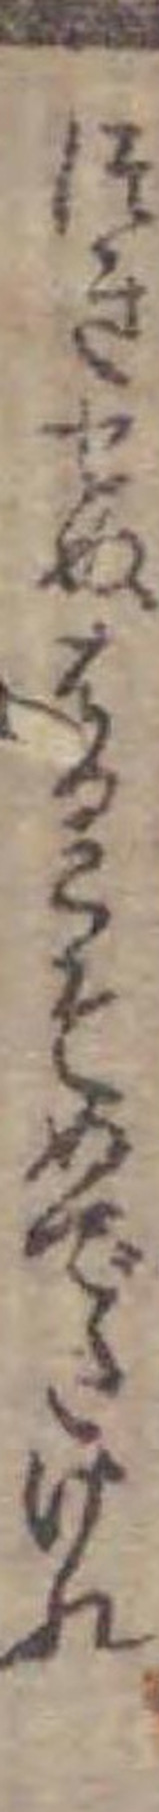つきせぬはるこそめでたけれ
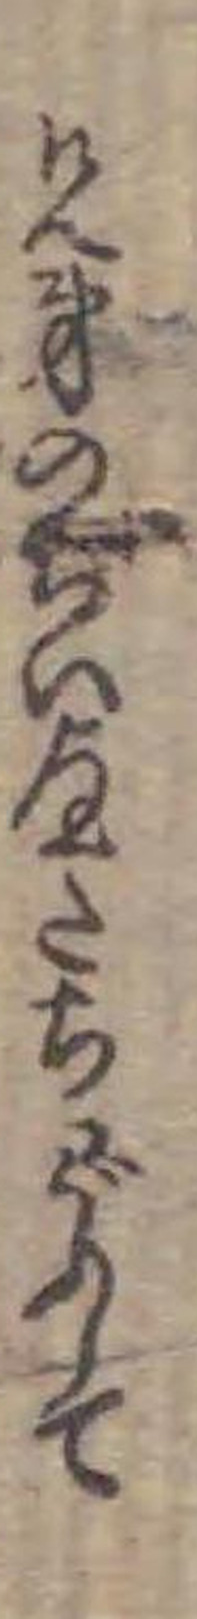兄第のぢい屋たちどふして
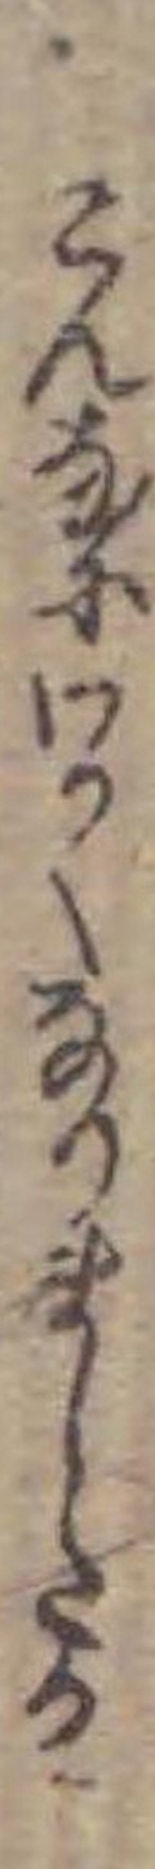こんなにワク〳〵なりましたか
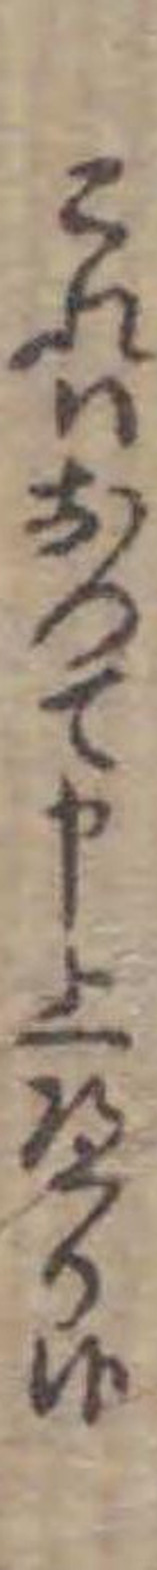これはおつて申上へり候
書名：年寄之冷水曽我 : 3巻
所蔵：国立国会図書館 National Diet Library, JAPAN
